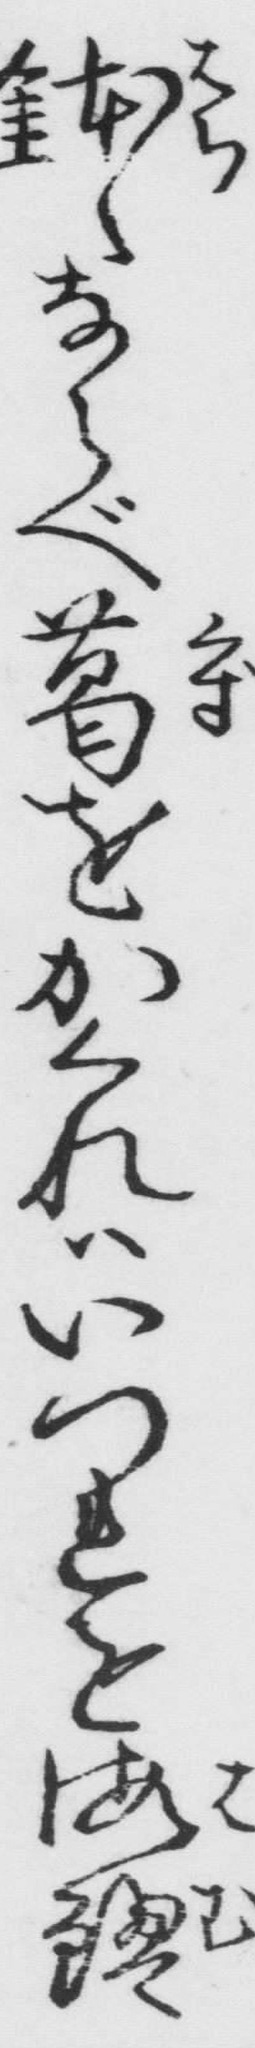鉢へならべ葛をかくれはいつれを海鱧
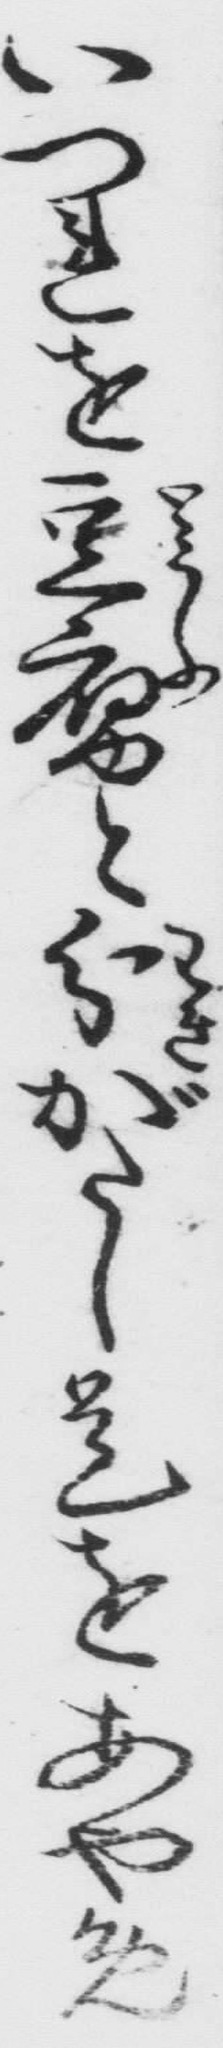いつれを豆腐と分がたし是をあやめ
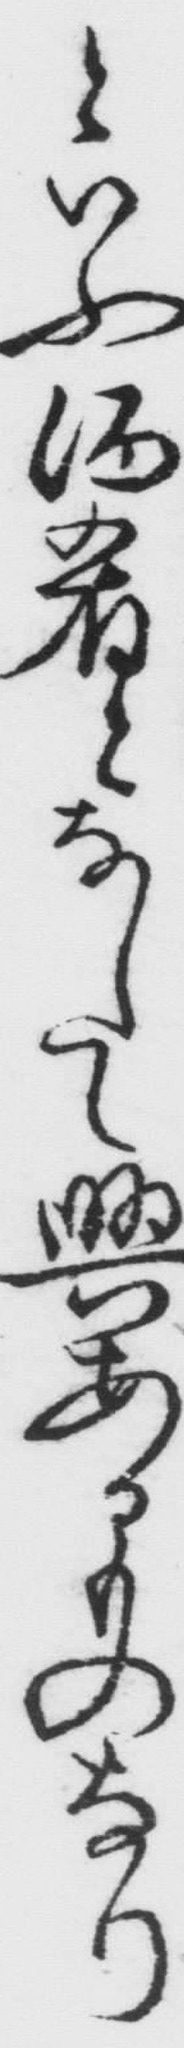といふ酒肴となして興あるものなり
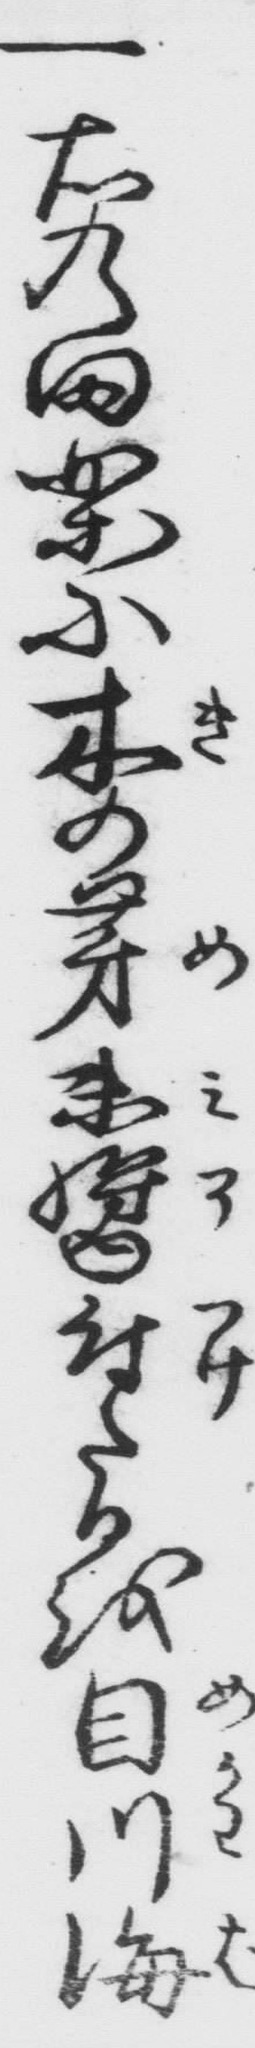一右の田楽に木の芽未醤付たるを目川海
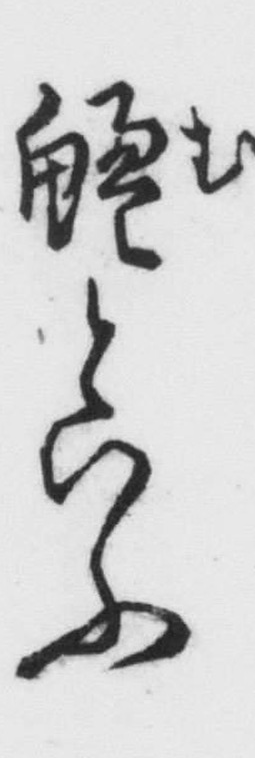鱧といふ
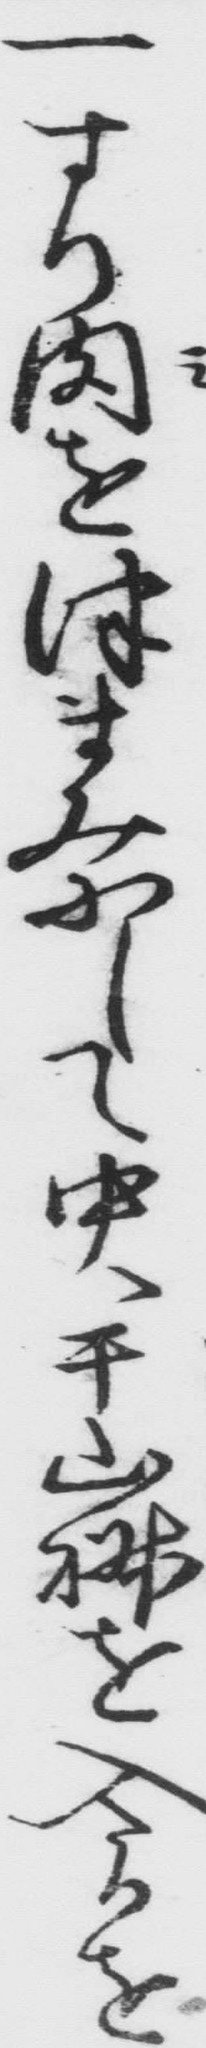一すり肉をつまみにして中へ干山椒を入たるを
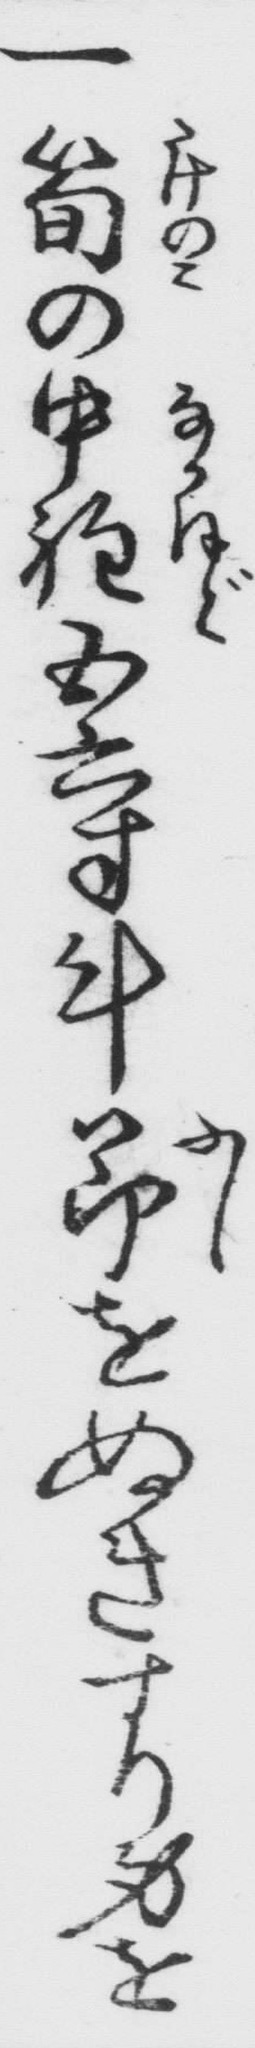一筍の中程五六寸斗節をぬきすり身を

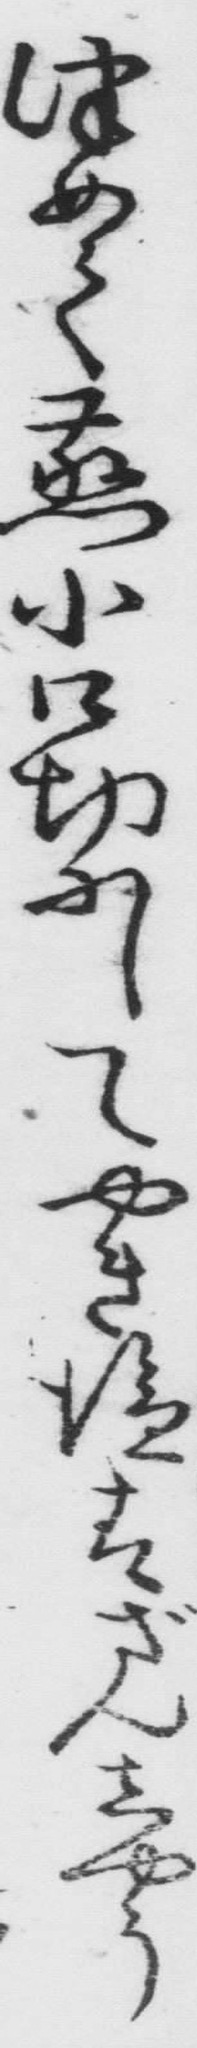つめて蒸小口切にしてやき塩青ざんしやう
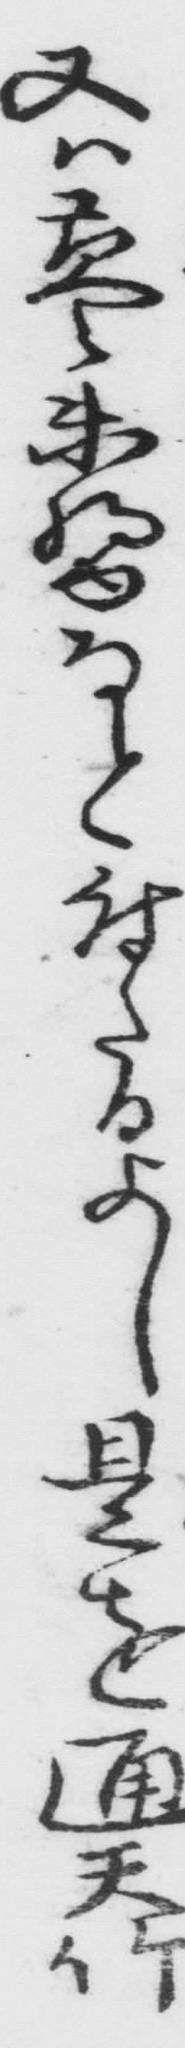又は蓼未醤なと付たるよし是を通天竹
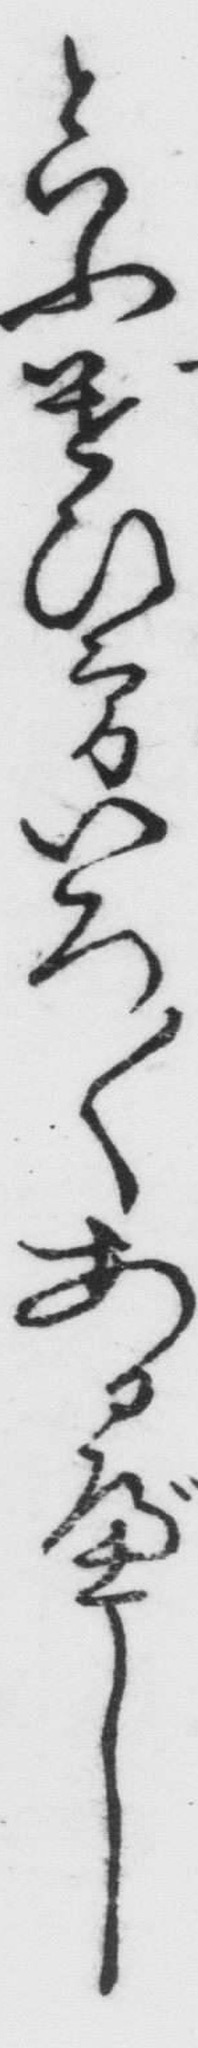といふ遣ひ方いろ〳〵あるべし
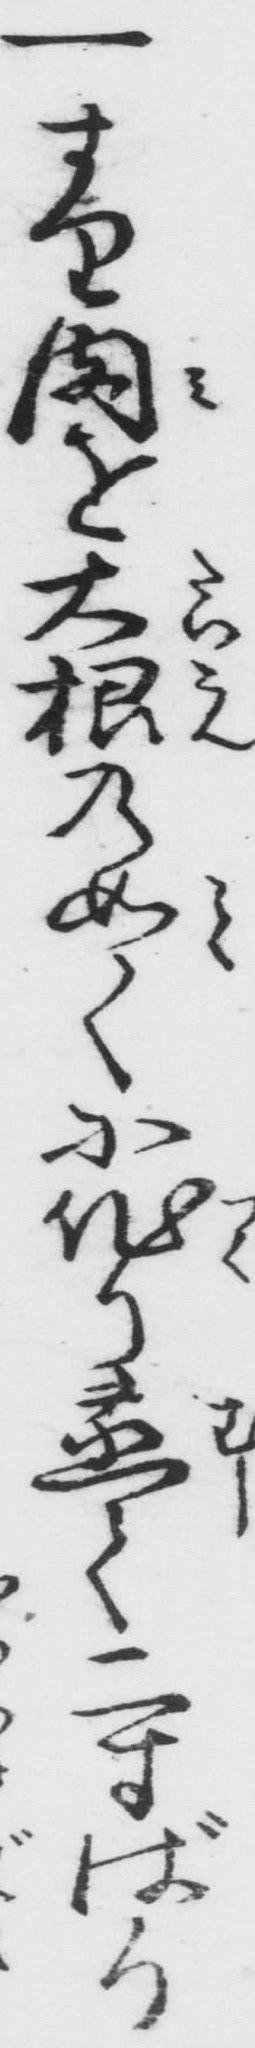一すり肉を大根の如くに作り蒸て二寸ばり
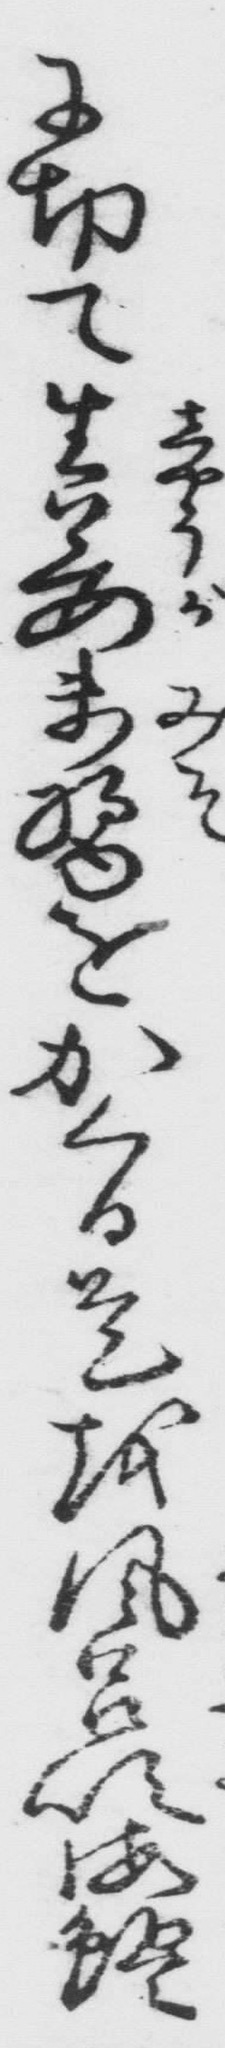に切て生姜未醤をかくる是を風呂吹海鱧
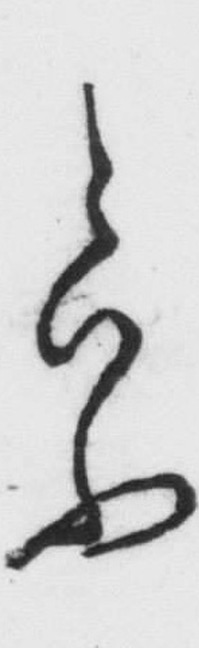といふ
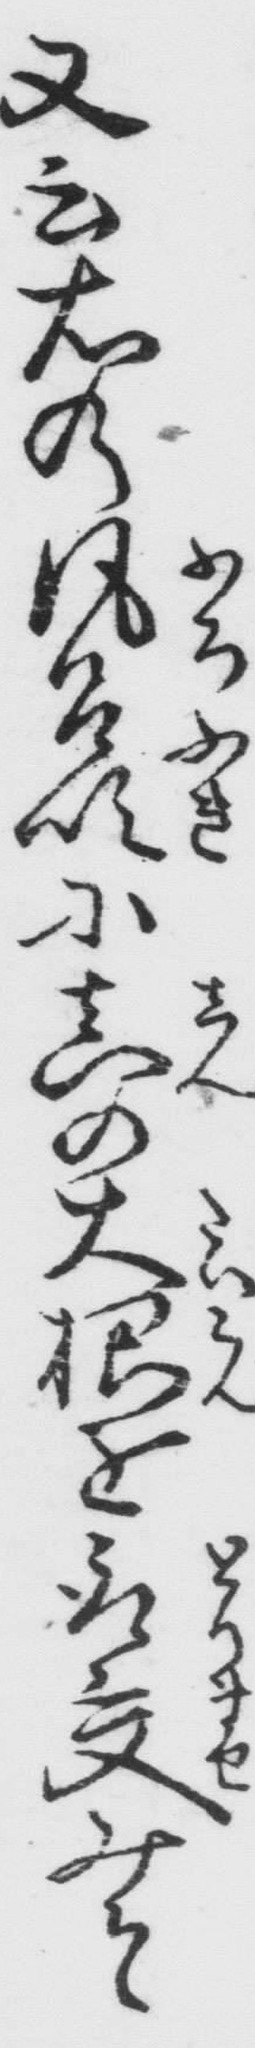又云右の風呂吹に真の大根を取交みそ
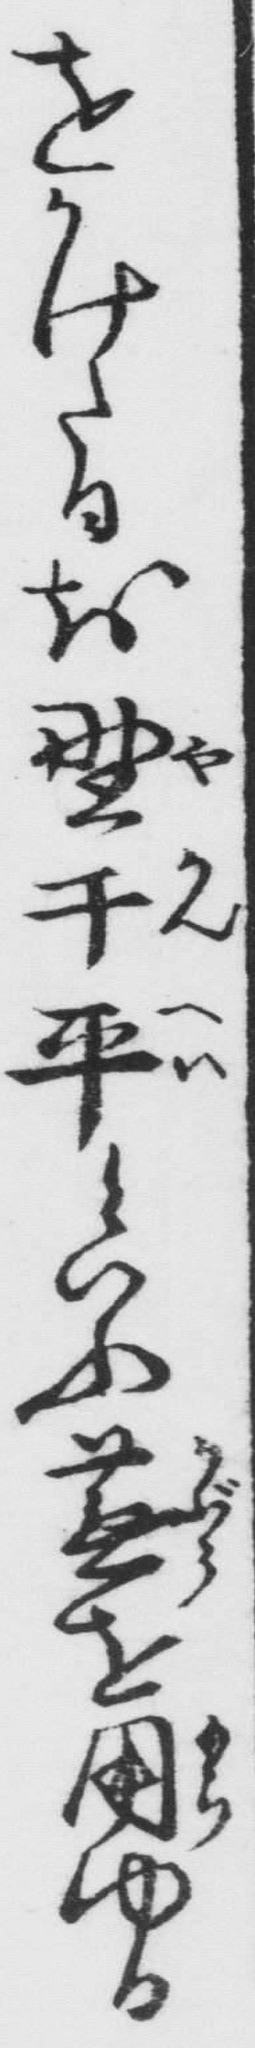をかけたるを野干平といふ蕪を用ゆる
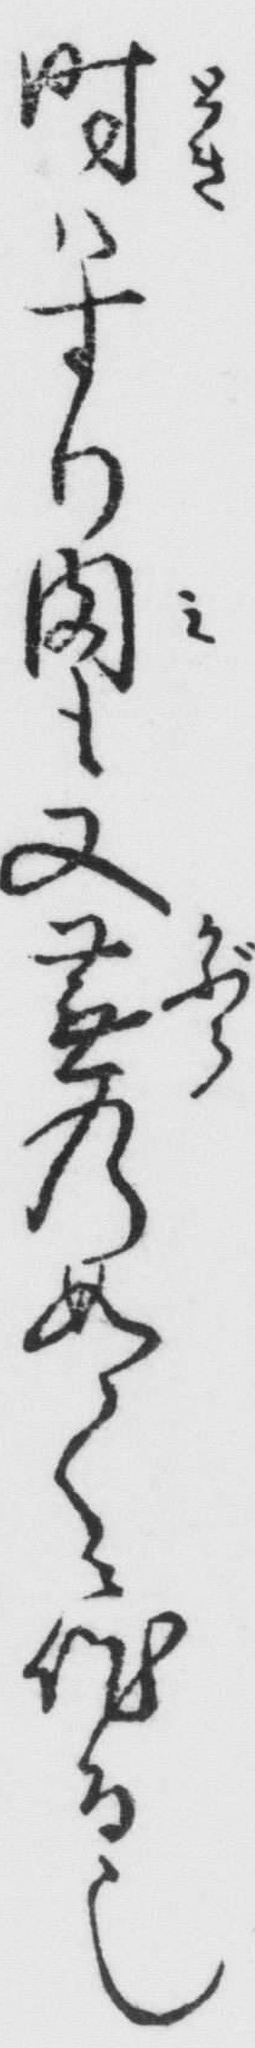時はすり肉も又蕪の如く作る也
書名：海鰻百珍
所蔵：大阪府立大学学術情報センター 国文学研究資料館
